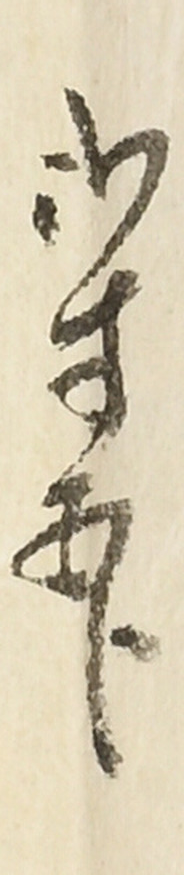三寸五分
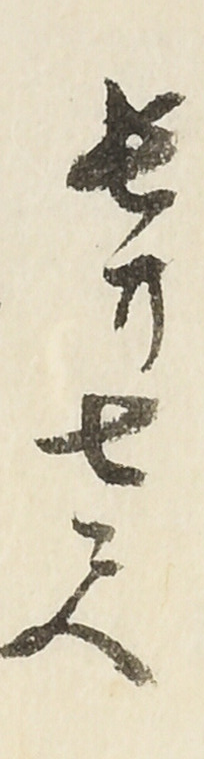長サ七尺
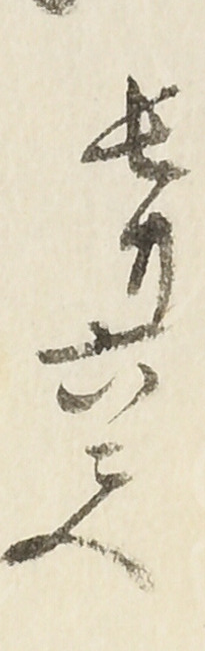長サ七尺
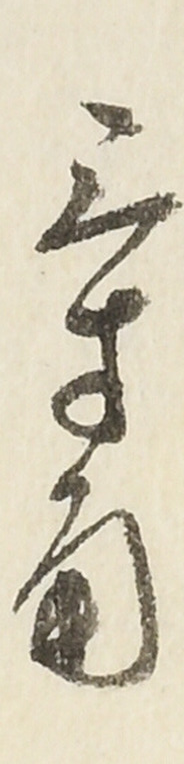三寸角
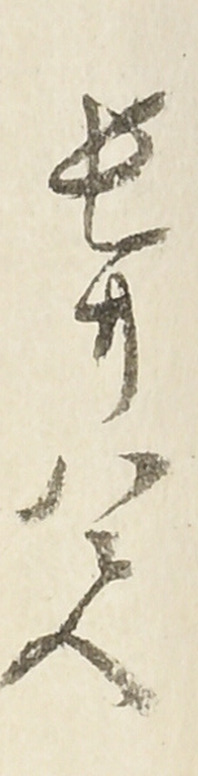長サ七尺
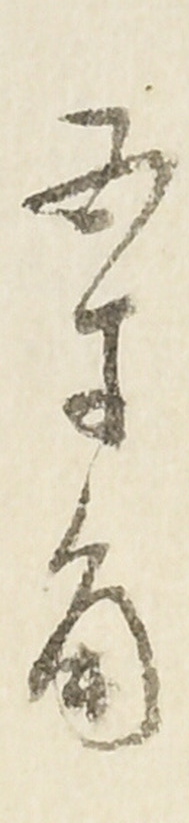五寸角
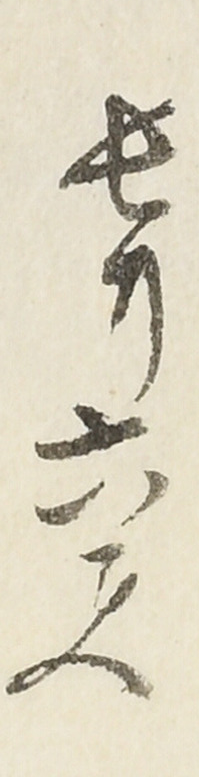長サ七尺
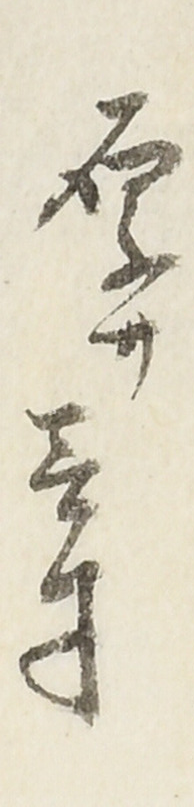厚サ壱寸
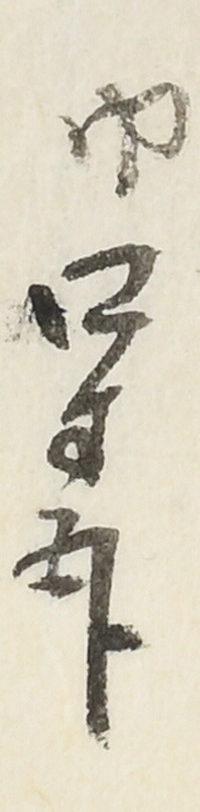巾四寸五分
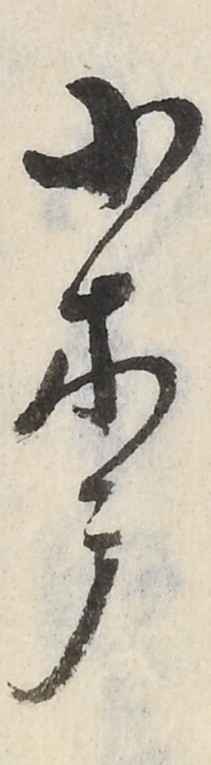大木戸
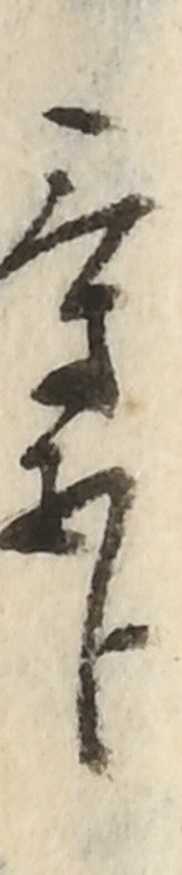三寸五分

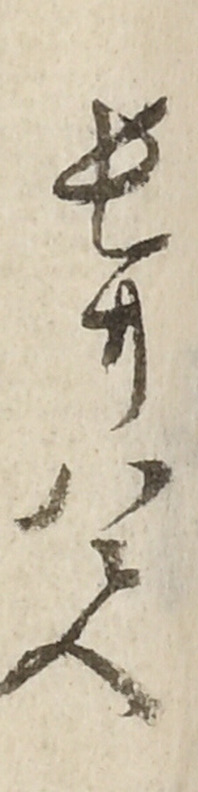長サ五尺
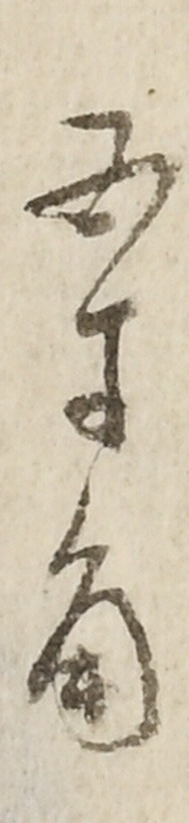三寸角
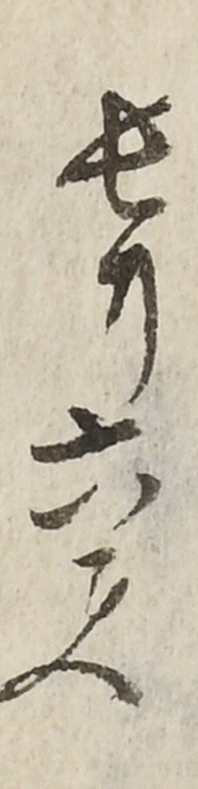長サ五尺
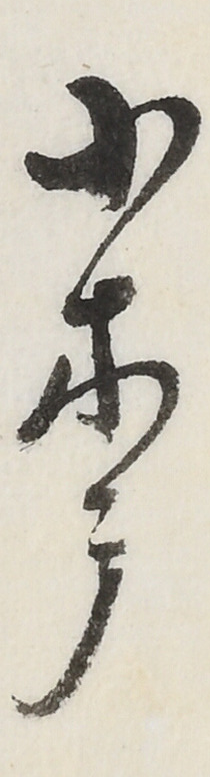小木戸
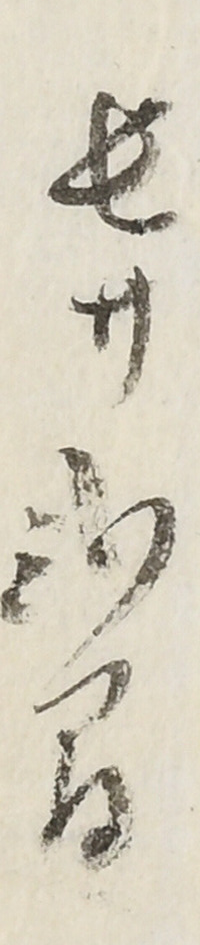長サ弐間
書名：町方木戸御普請諸事附（一括）
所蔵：伊那市立高遠町図書館・合同会社AMANE
